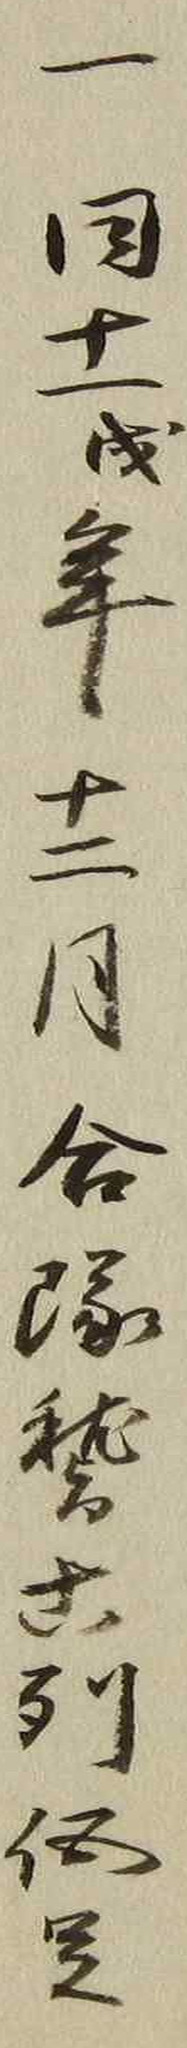一同十一戌年十二月合隊稽古列伍足
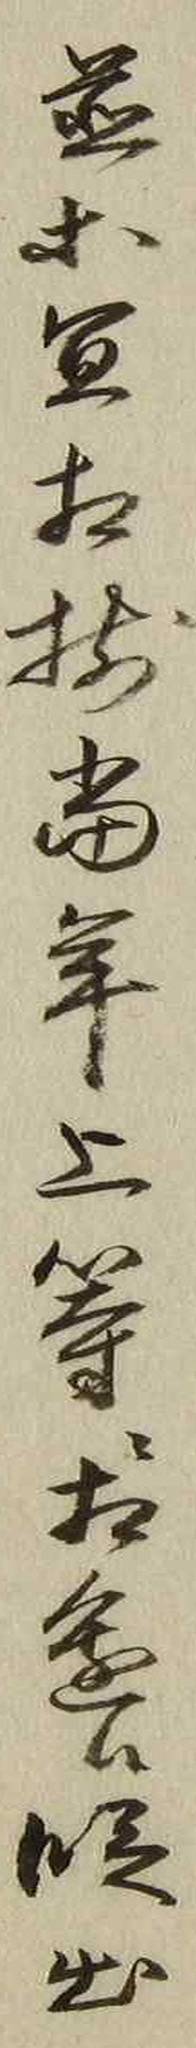並等宜相揃当年上等ニ相進候段出
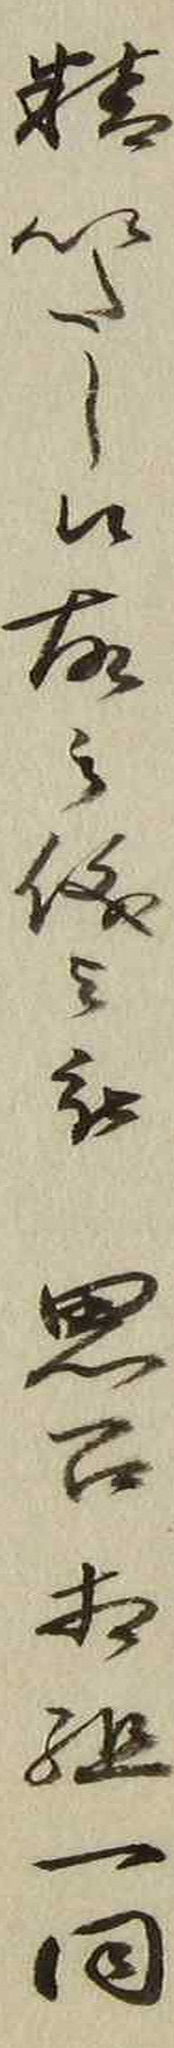精いたし候故之儀与被思召相組一同
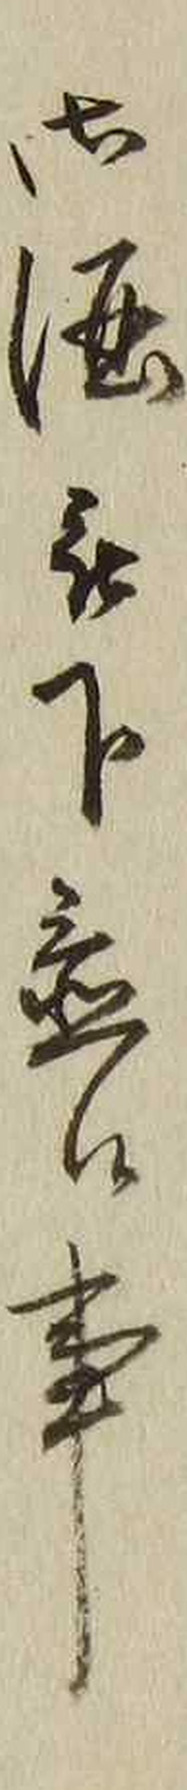御酒被下置候事
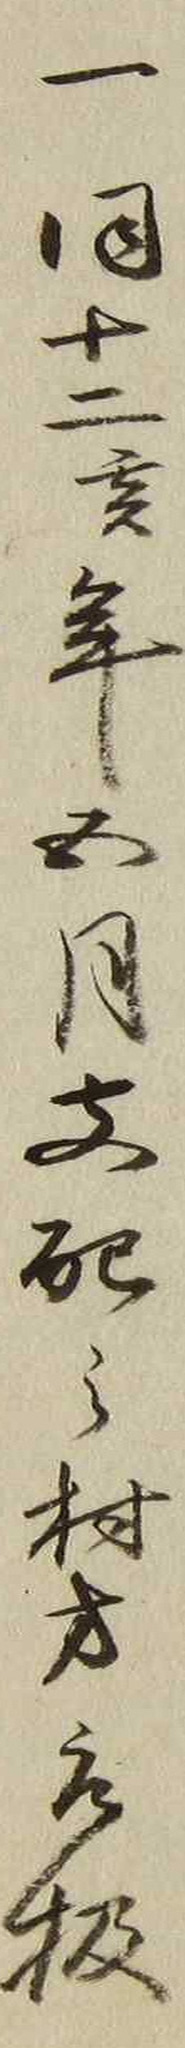一同十二亥年五月支配之村方取扱
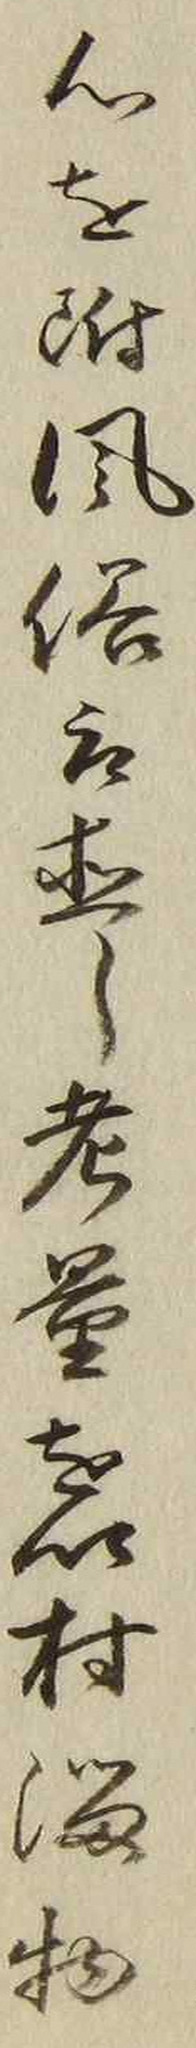心を附風俗取直し考量を以村溜物
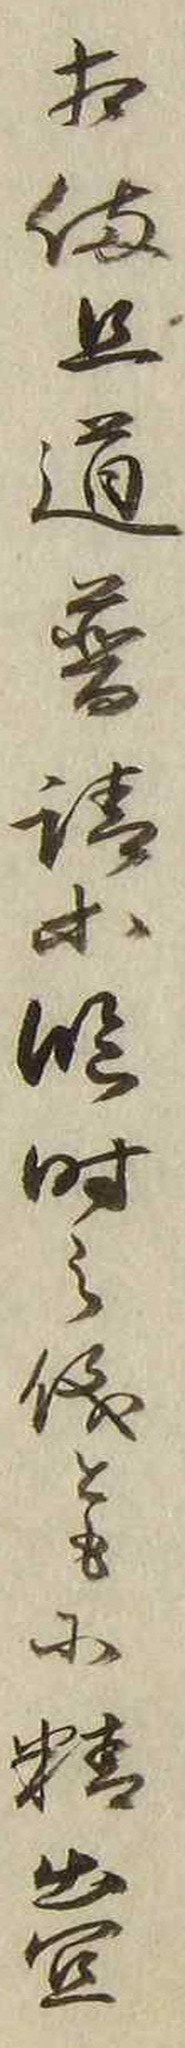相備且道普請等臨時之儀ともに精出宜
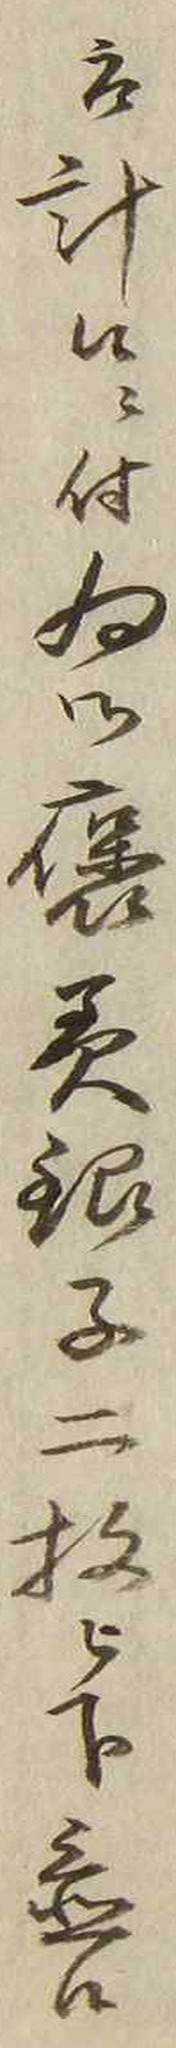取計候ニ付為御褒美銀子二枚被下置候

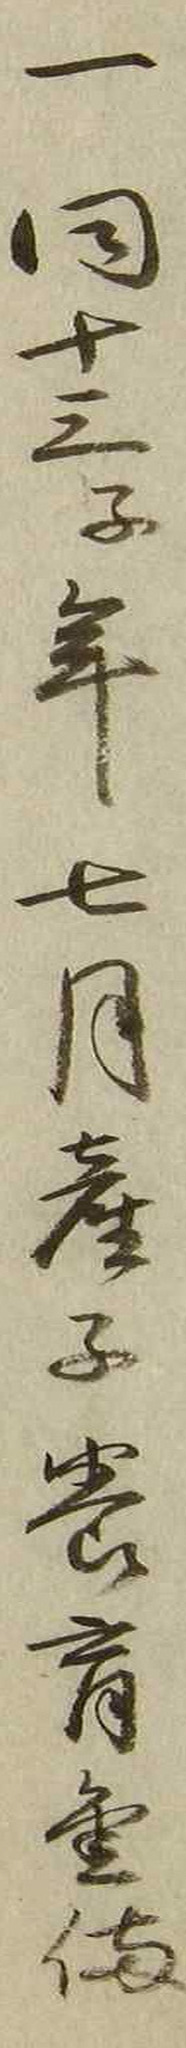一同十三子年七月産子養育金備
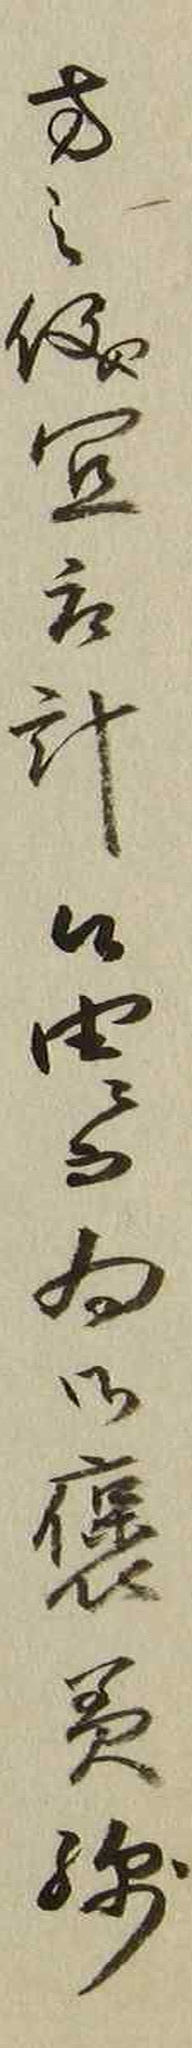方之儀宜取計候由ニ而為御褒美綿
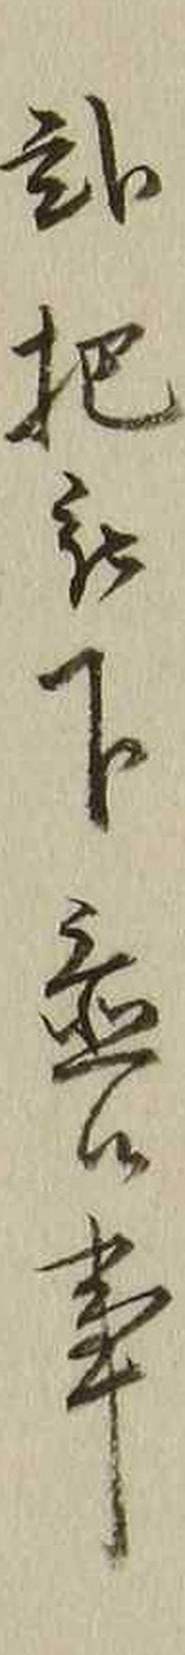弐把被下置候事
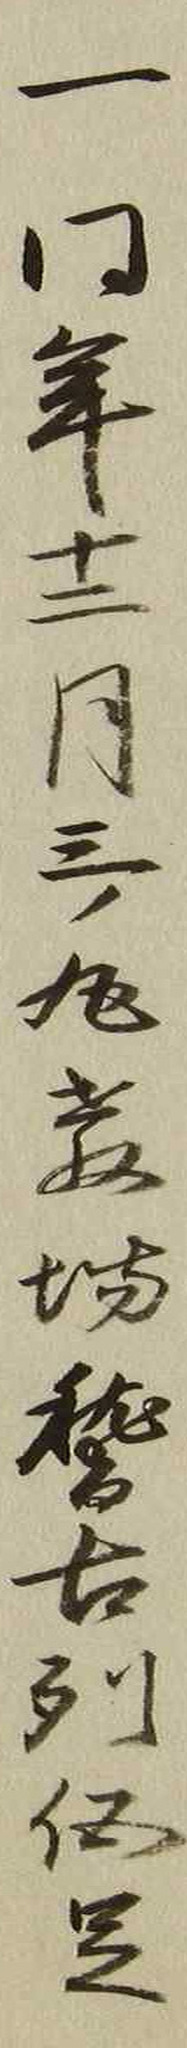一同年十二月三ノ丸教場稽古列伍足
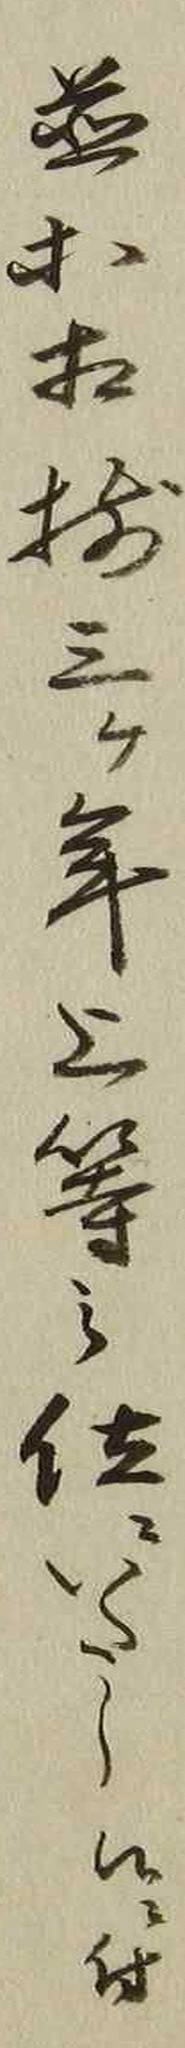並等相揃三ヶ年上等之位ニいたし候ニ付
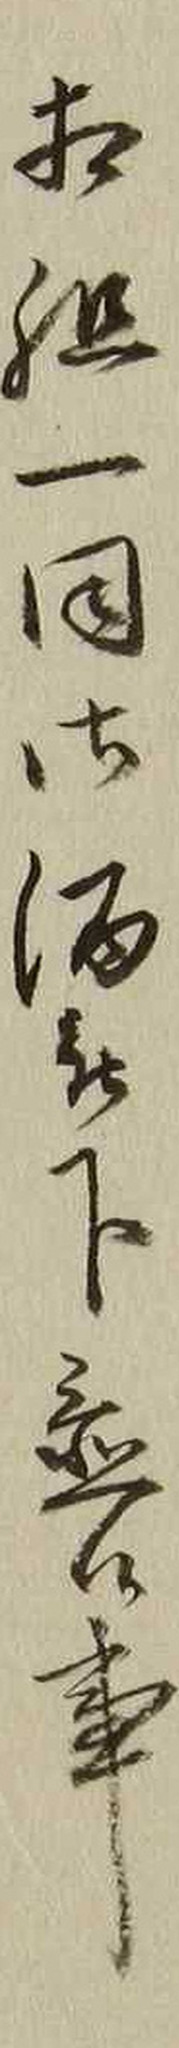相組一同御酒被下置候事
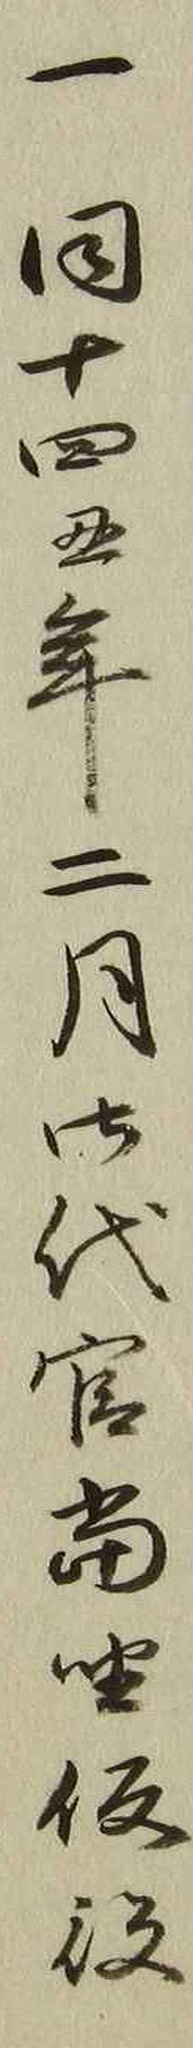一同十四丑年二月御代官当坐仮役
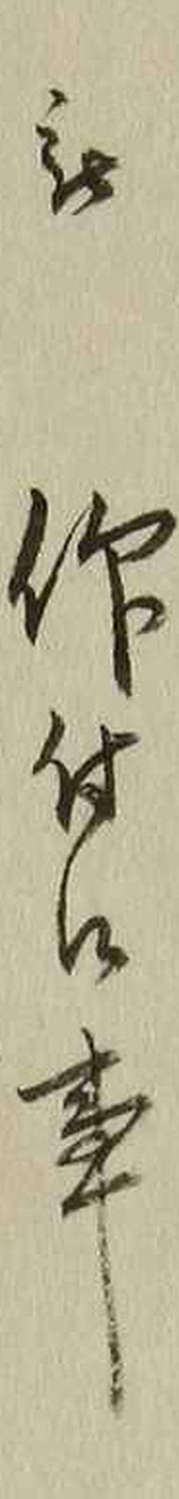被仰付候事
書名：諸士系譜　巻之128　た之部4
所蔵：会津若松市立会津図書館
